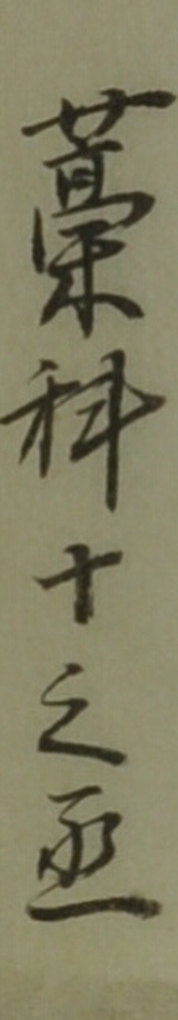藁科十之丞
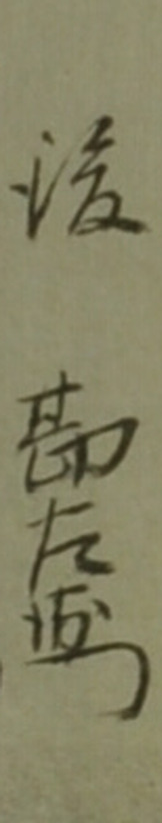後勘左衛門
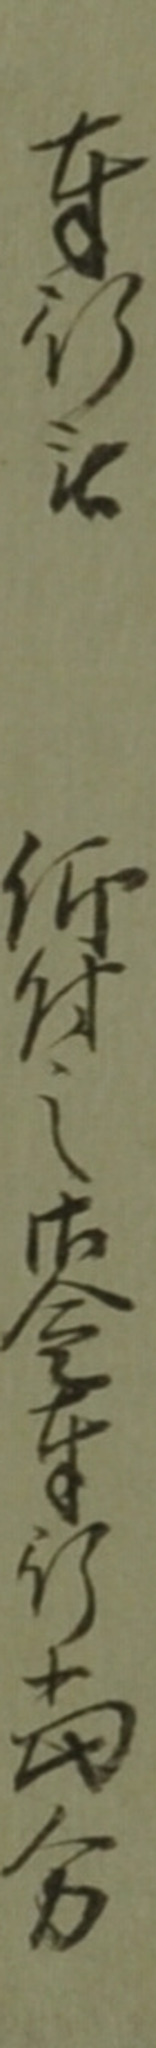奉行被仰付之御金奉行当分
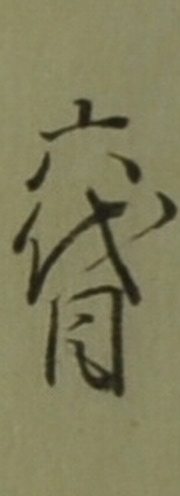六代目

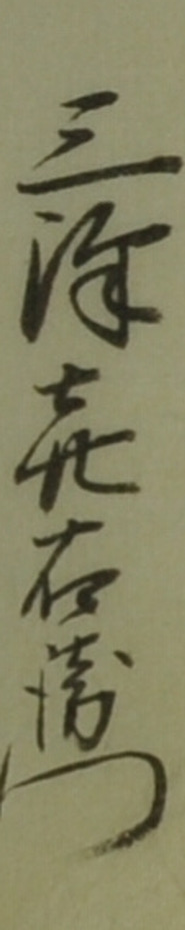三◻︎喜右衛門
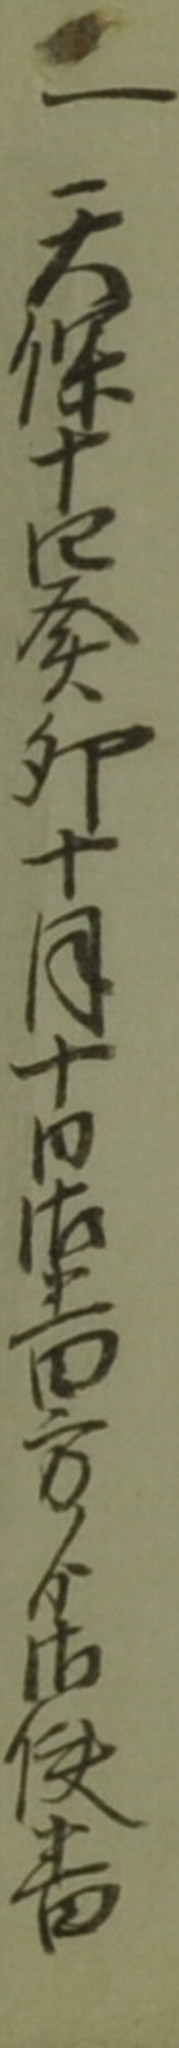一天保十四癸卯十月十日御番方ゟ御使番
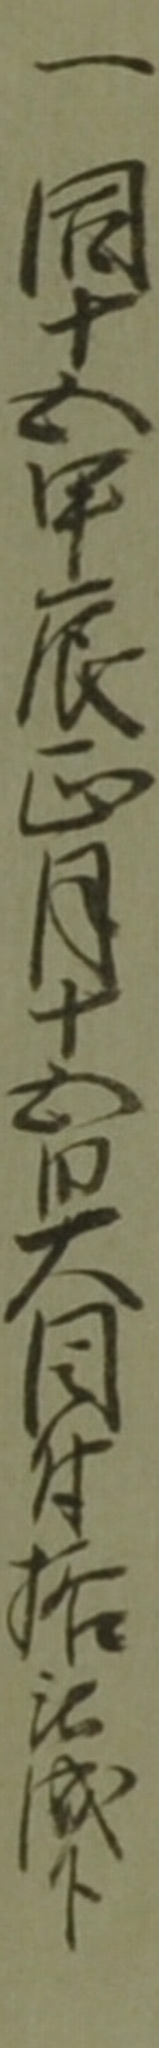一同十五甲辰正月十五日大目付格被成下
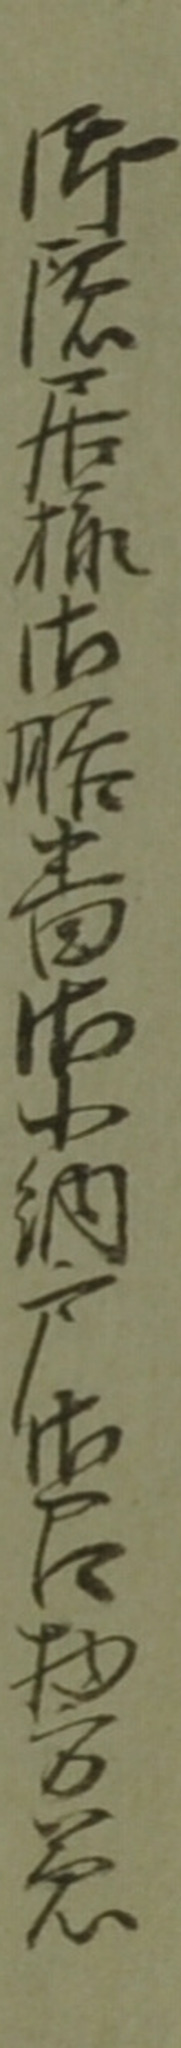御隠居様御膳番御小納戸御召物方兼
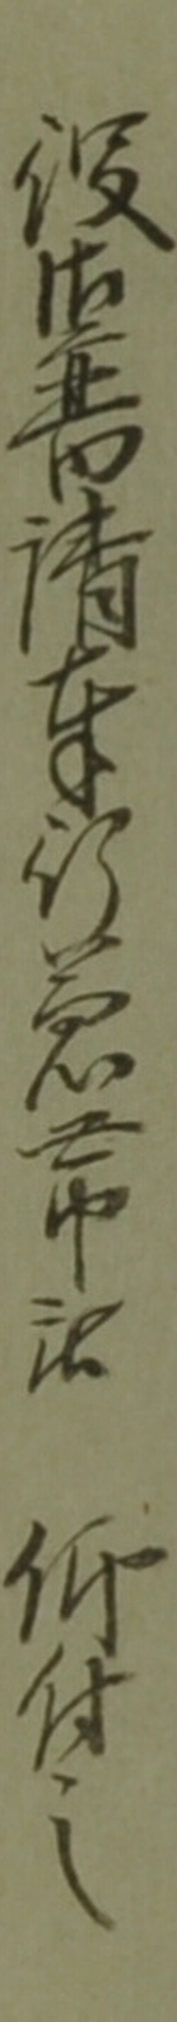役御普請奉行兼帯被仰付之
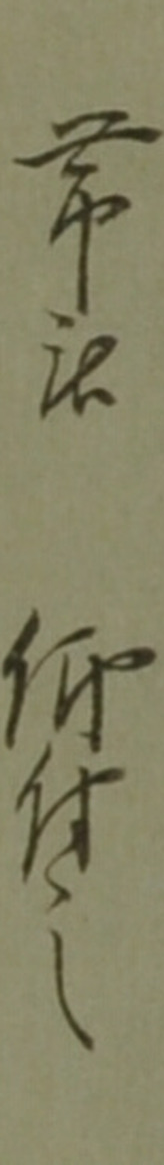帯被仰付之
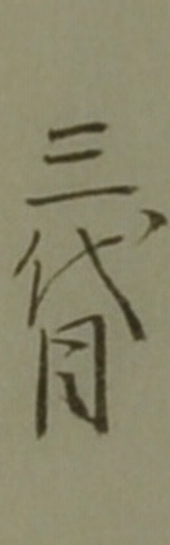三代目
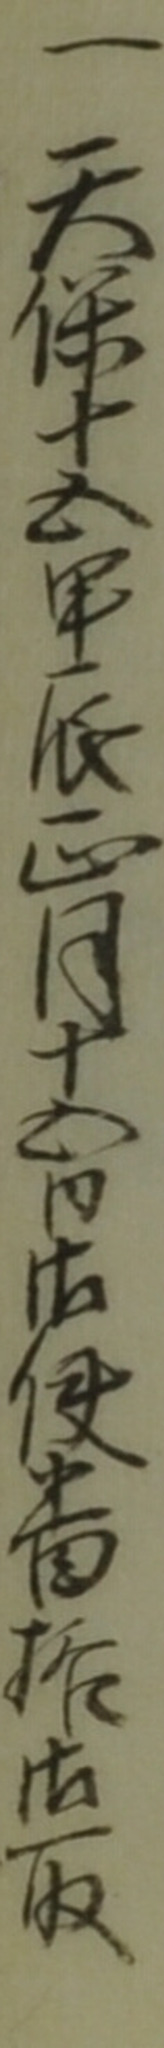一天保十五甲辰正月十五日御使番格御取
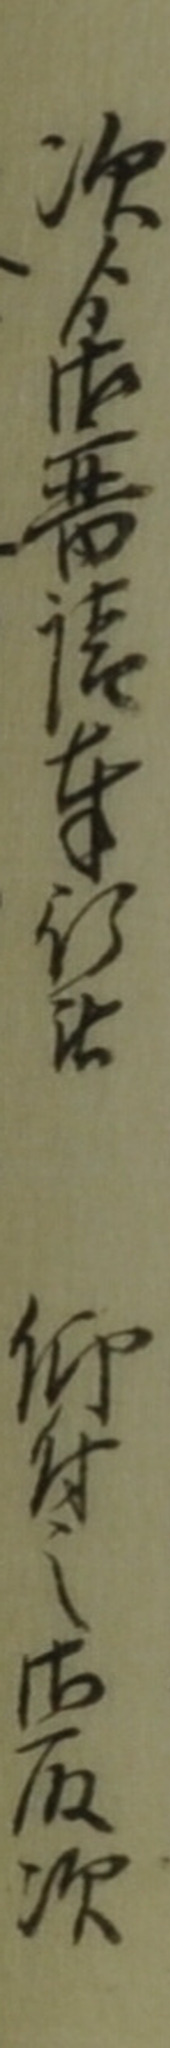次ゟ御普請奉行被仰付之御取次
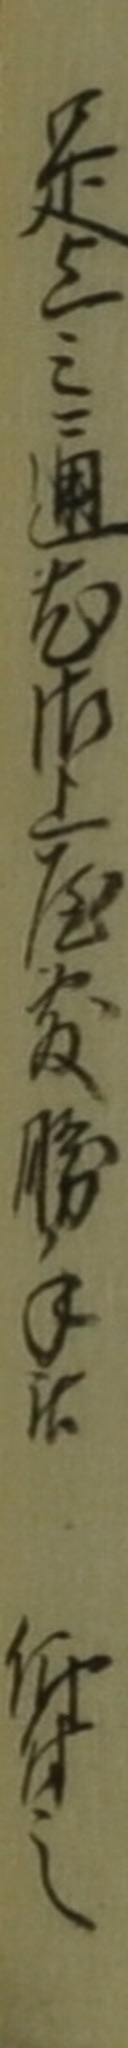是迄之通尤御上屋敷勝手被仰付之
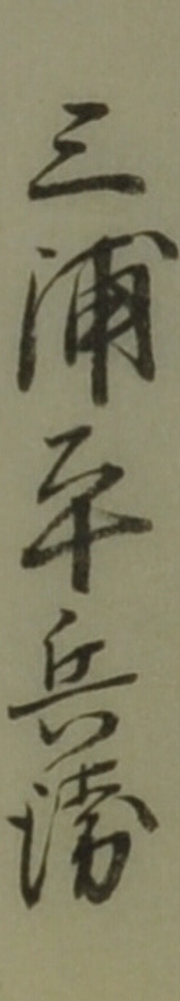三浦平兵衛
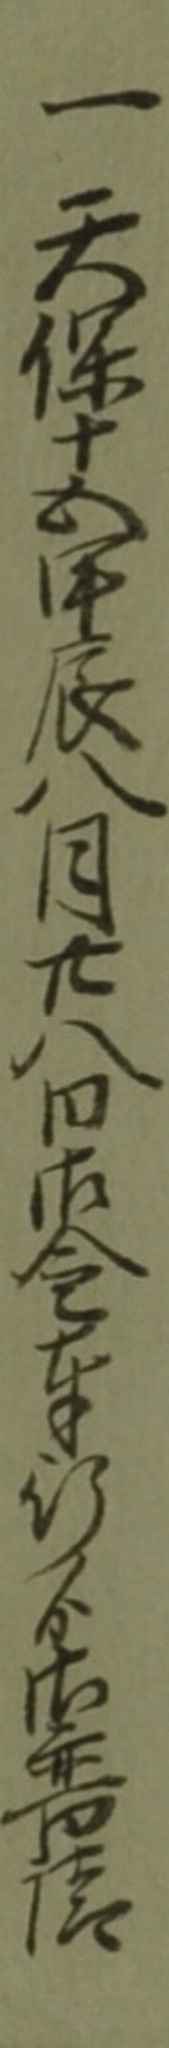一天保十五甲辰八月廿八日御金奉行ゟ御普請
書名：諸御役代々録（六）
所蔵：伊那市立高遠町図書館・合同会社AMANE
